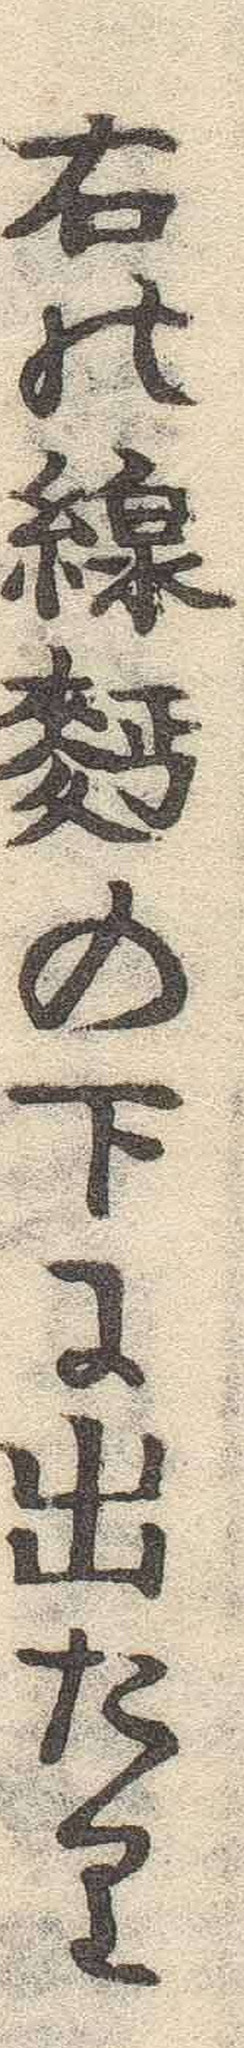茶とうふの下に出たり
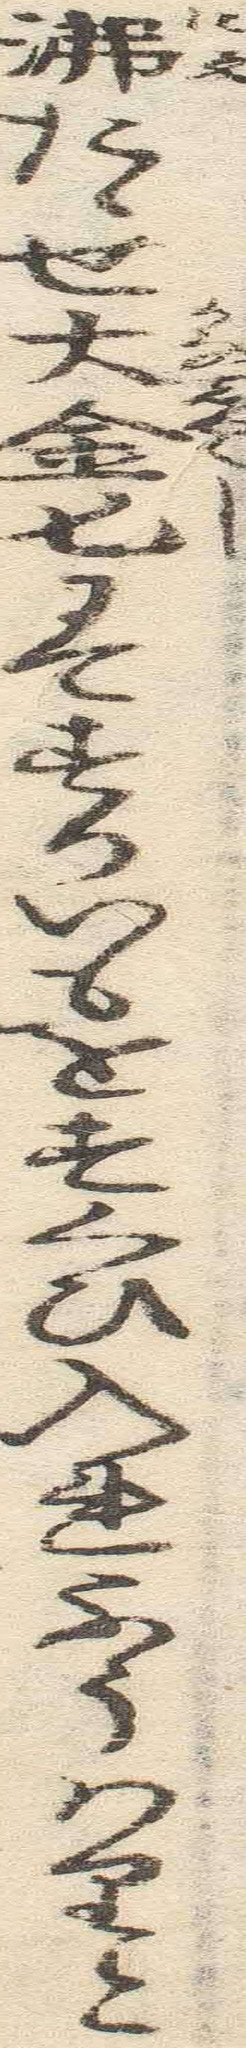沸たゝせ大金匕にてすりいもをすくひ入れふうはりと
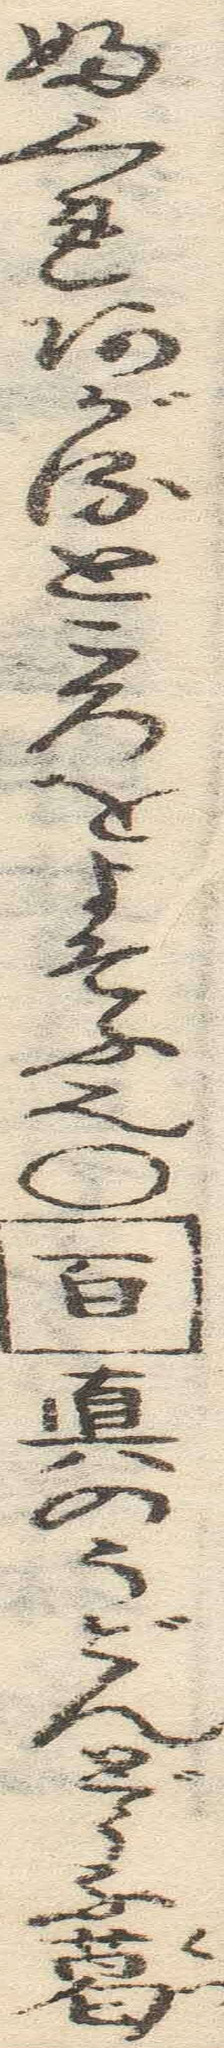ふくれあがるところをよそふ也○[百]真のうどんどうふ葛
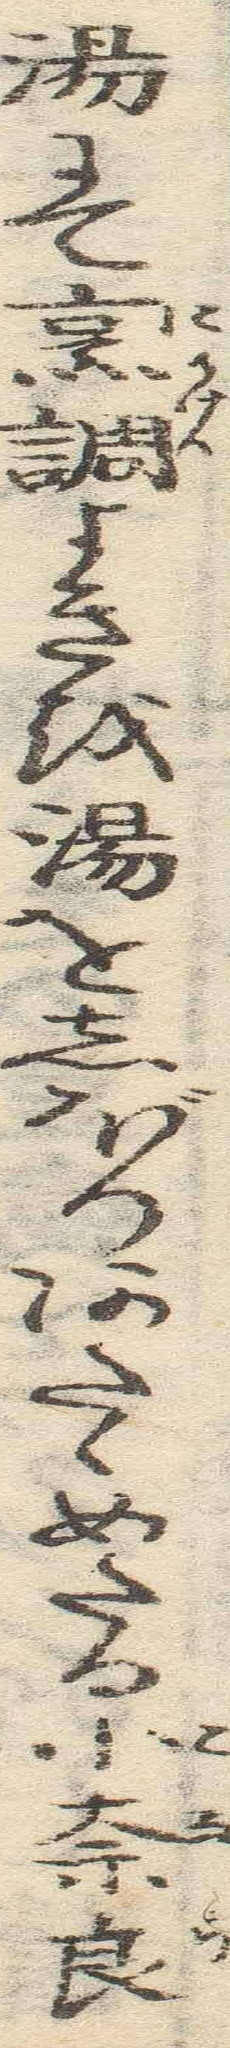湯にて烹調よきを湯をしぼりあたゝめたる小奈良
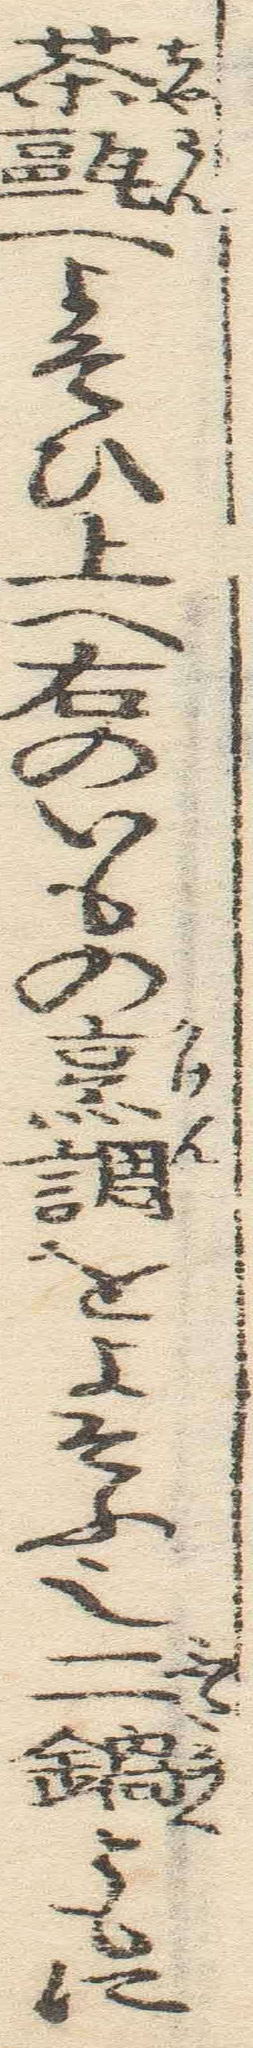茶甌へよそひ上へ右のいもの烹調をよそふ也二鍋ともに
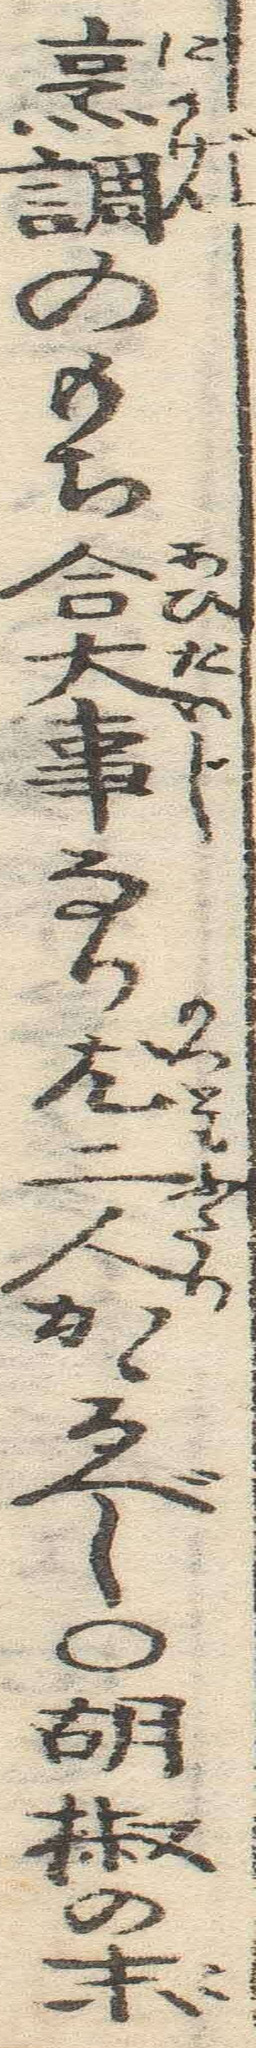烹調のもち合大事なり尤二人かゝるべし○胡椒の末
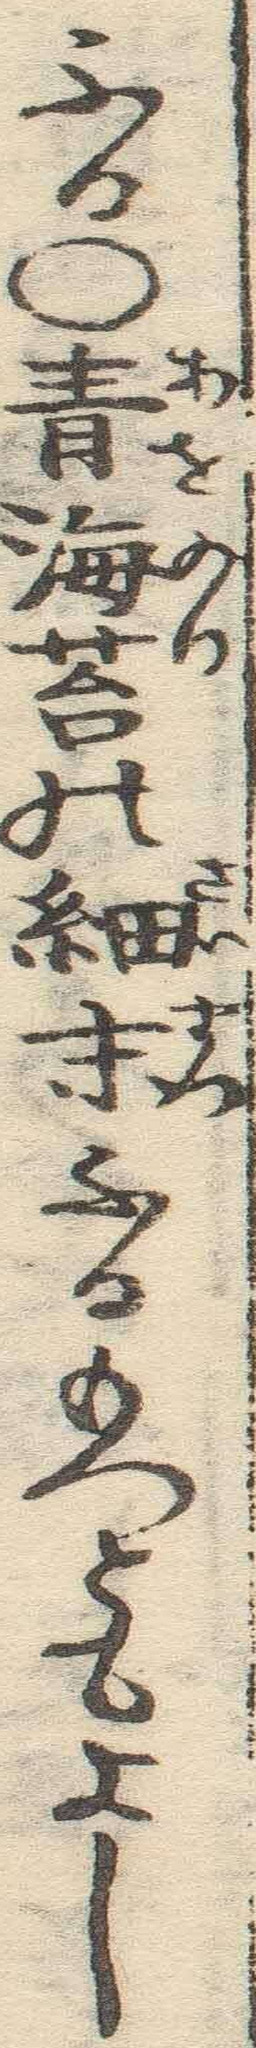ふる○青海苔の細末ふるもつともよし
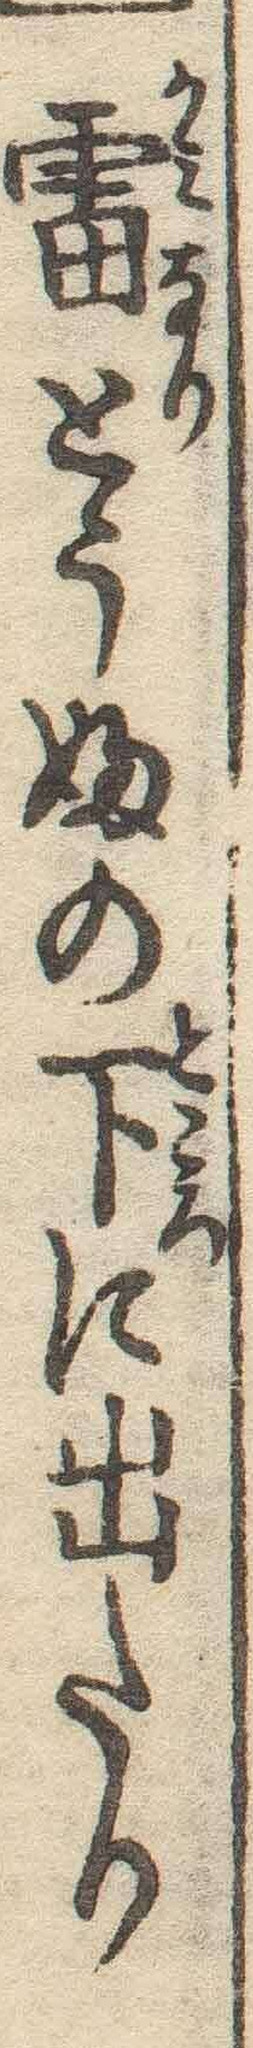茶とうふの下に出たり

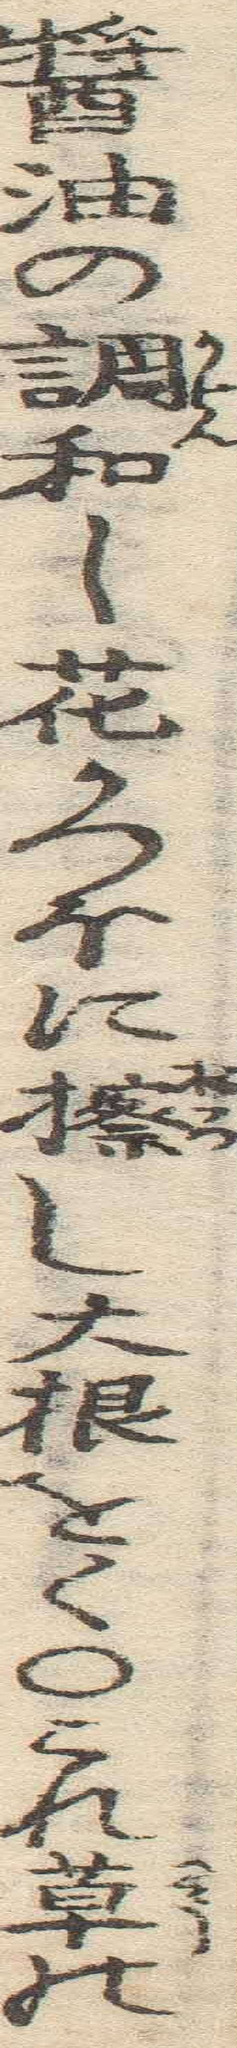醤油の調和し花かつほに擦し大根をく○これ草の
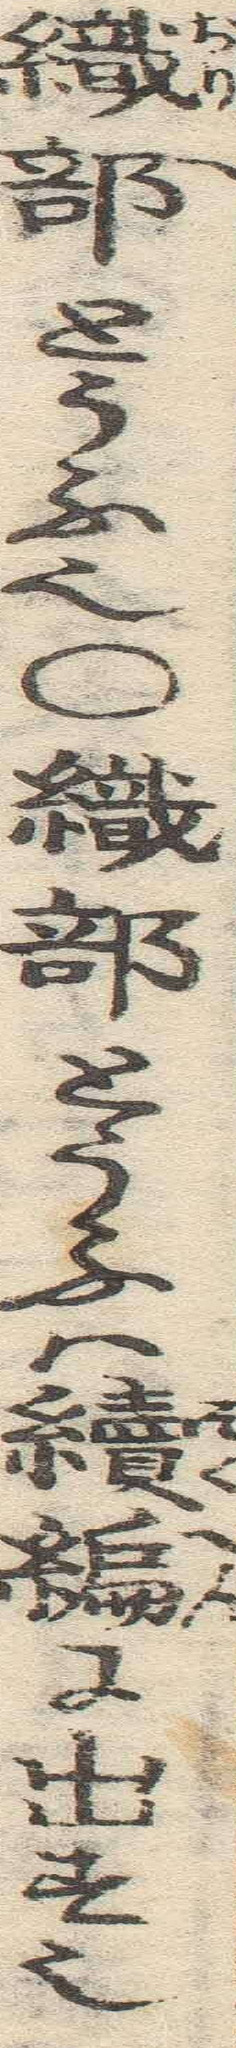織部とうふ也○織部とうふは続編に出す也
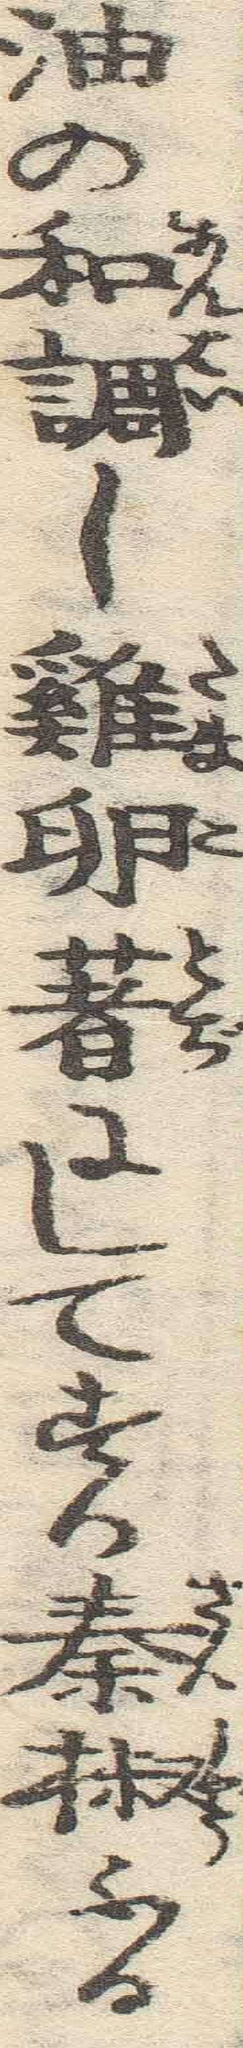油の和調し鶏卵著にしてすり秦椒ふる
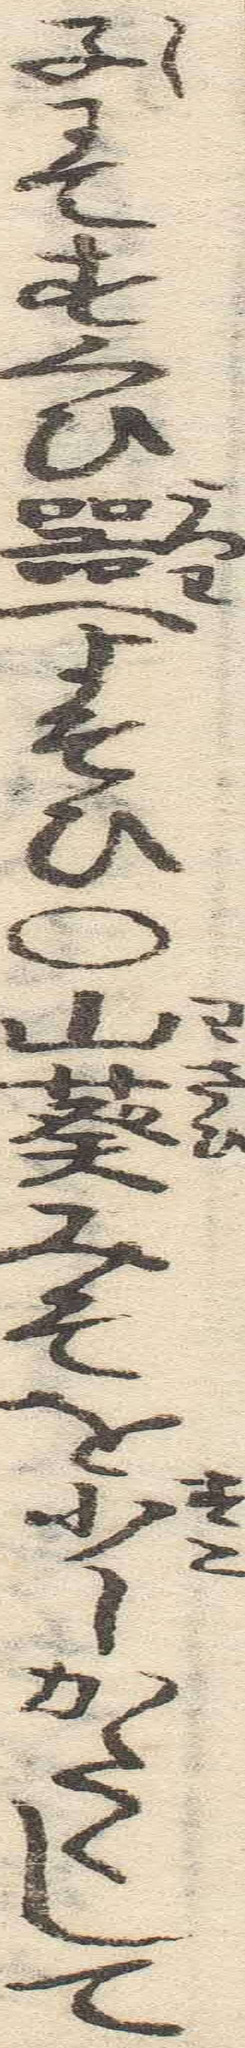子にてすくひ器へよそひ○山葵みそを少しかたくして
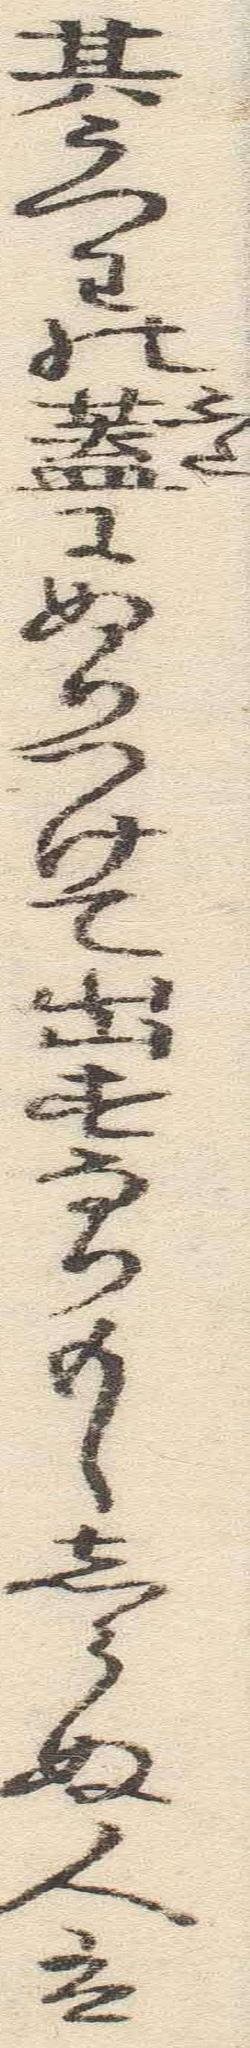其うつわの蓋にぬりつけて出すなりもししらぬ人は
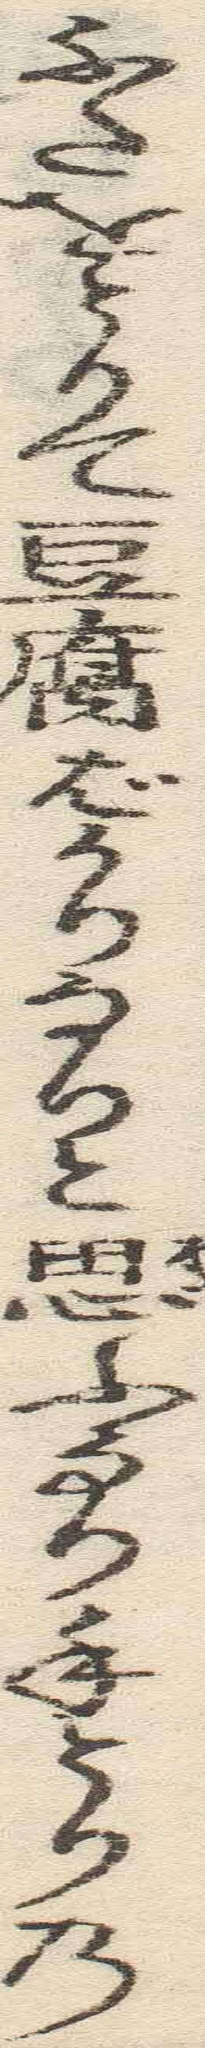ふたをとりて豆腐ばかりなりと思ふなり手とりの
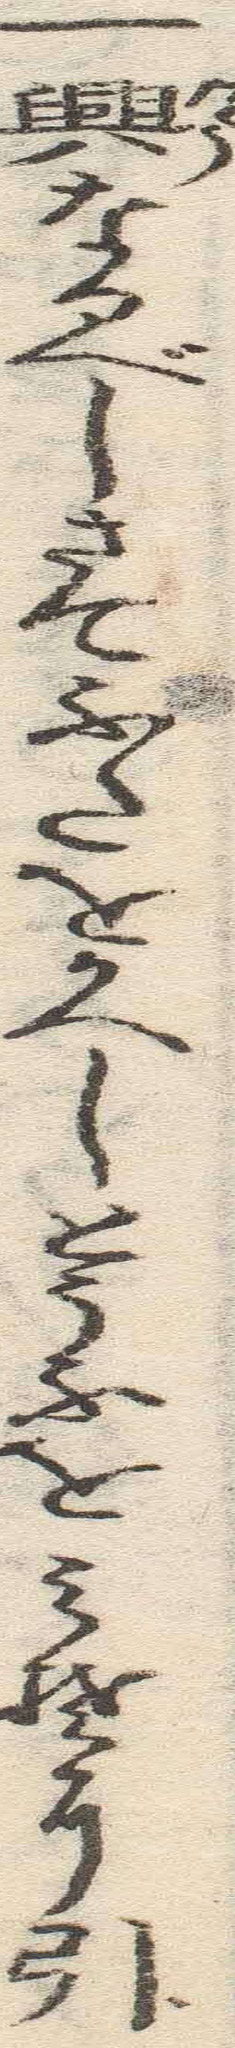一興なるべしさてふたをかへしとうふをみそに引
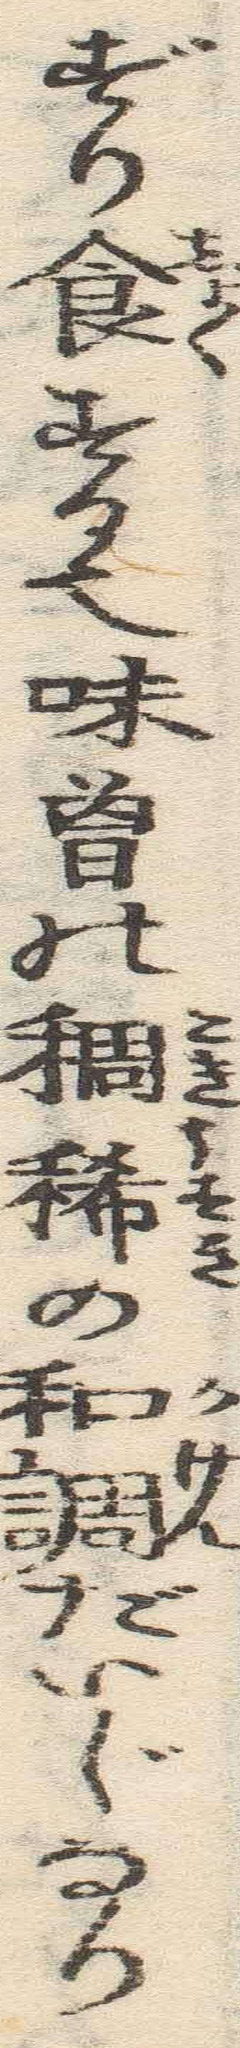ずり食する也味曽の稠稀の和調だいじなり
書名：豆腐百珍
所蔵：東京学芸大学附属図書館 国文学研究資料館
